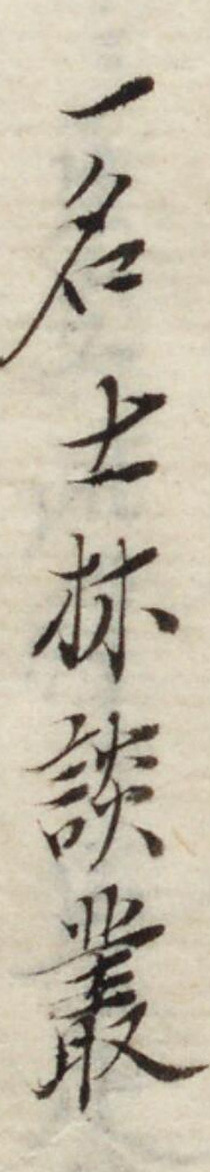一名士林談叢
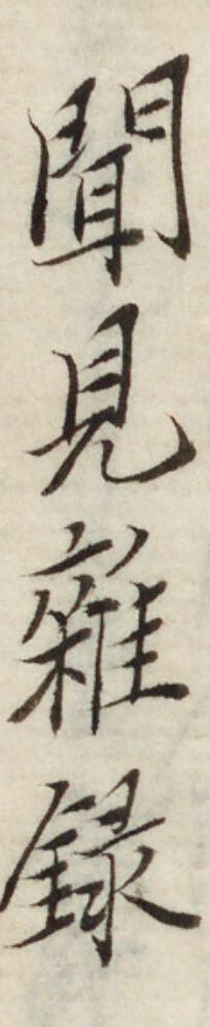聞見雑録

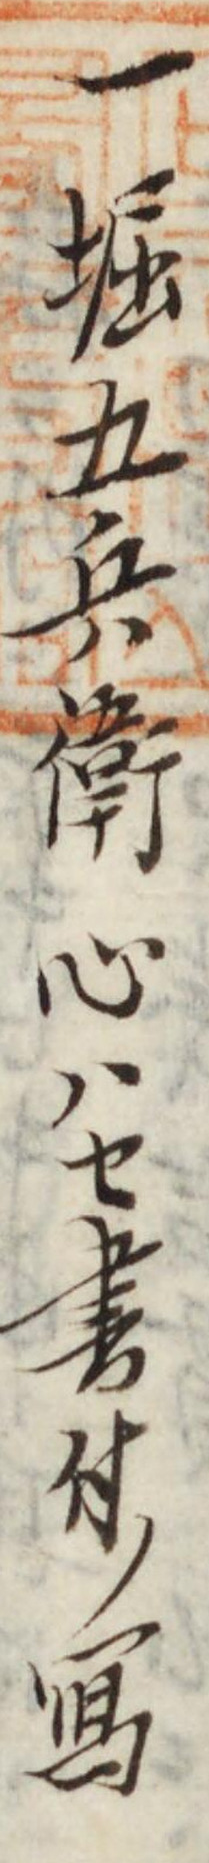一堀五兵衛心ハセ書付ノ写
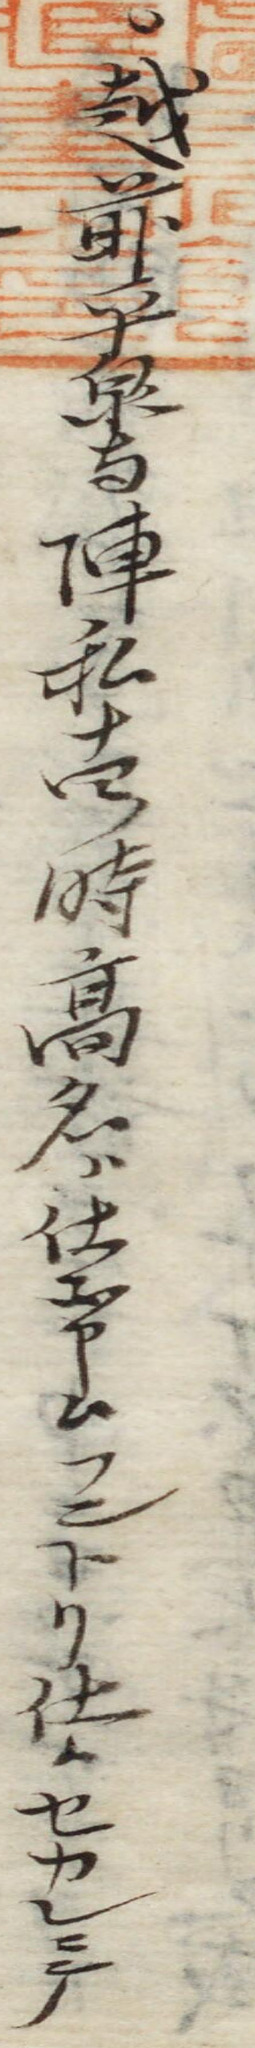○越前平泉与陣私十四ノ時高名仕申候フントリ仕候セカレニテ
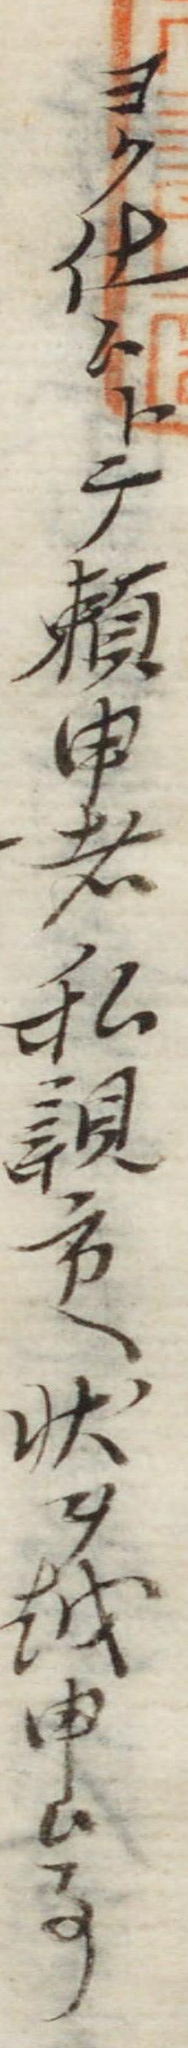ヨク仕候トテ頼申者私親方へ状ヲ越申候事
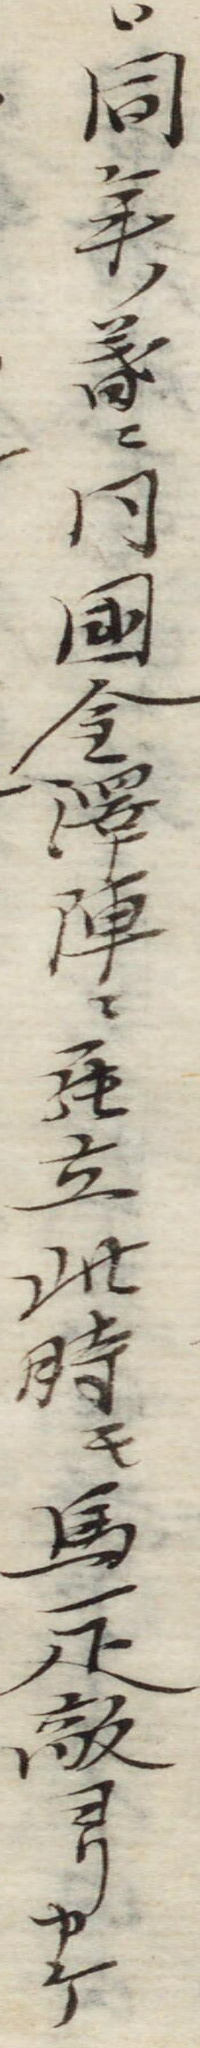○同年ノ暮ニ同国金澤陣ニ罷立此時モ馬一疋敵ヨリカケ
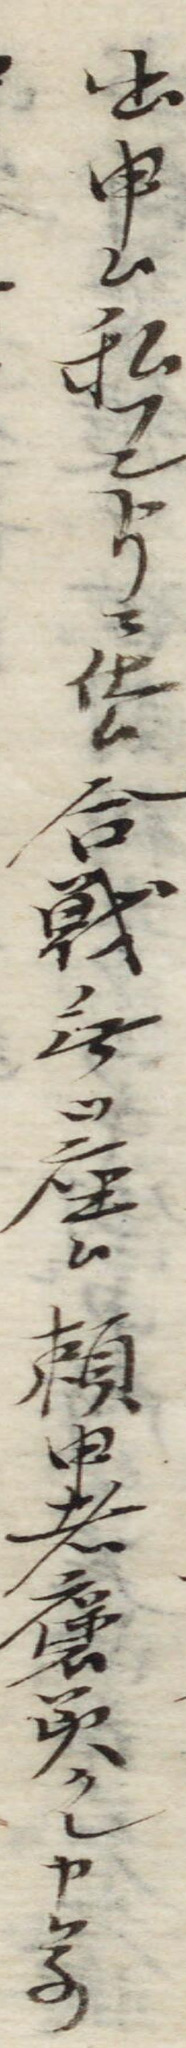出申候私フントリニ仕候合戦無御座候頼申者褒美ラレ申候事
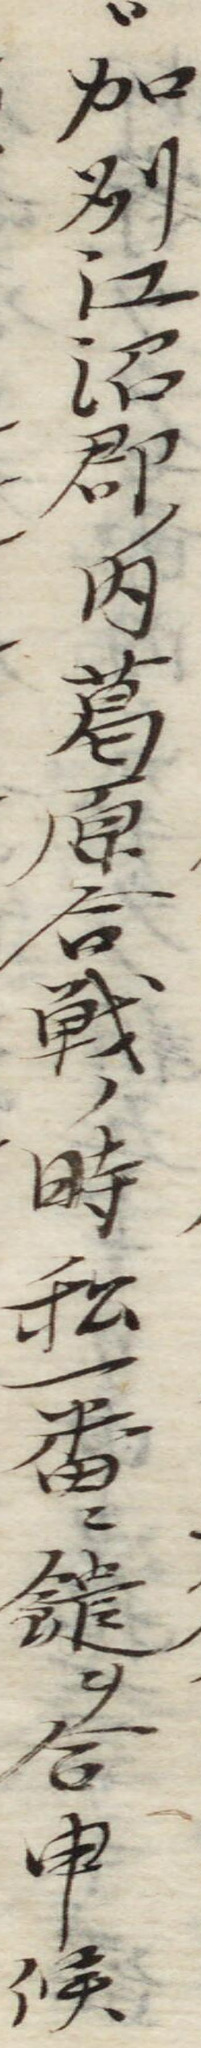○加州江沼郡之ノ内葛原合戦ノ時私一番ニ鑓ヲ合申候
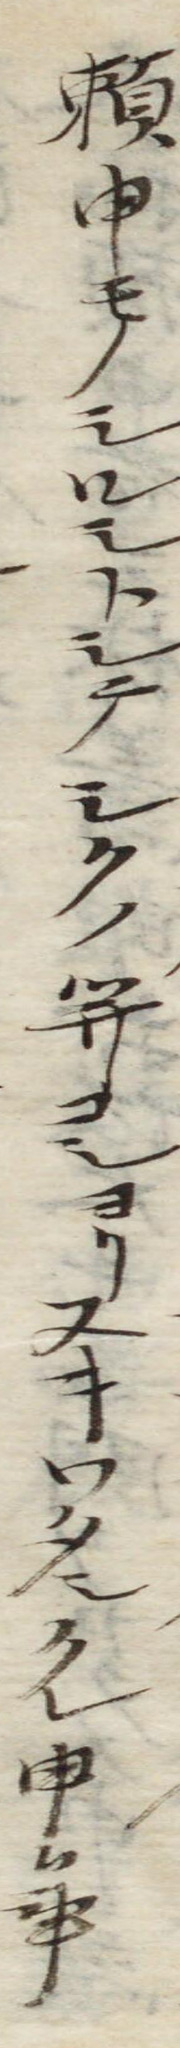頼申モノシルシトシテシクノ并コシヨリ又キワタシクレ申候事
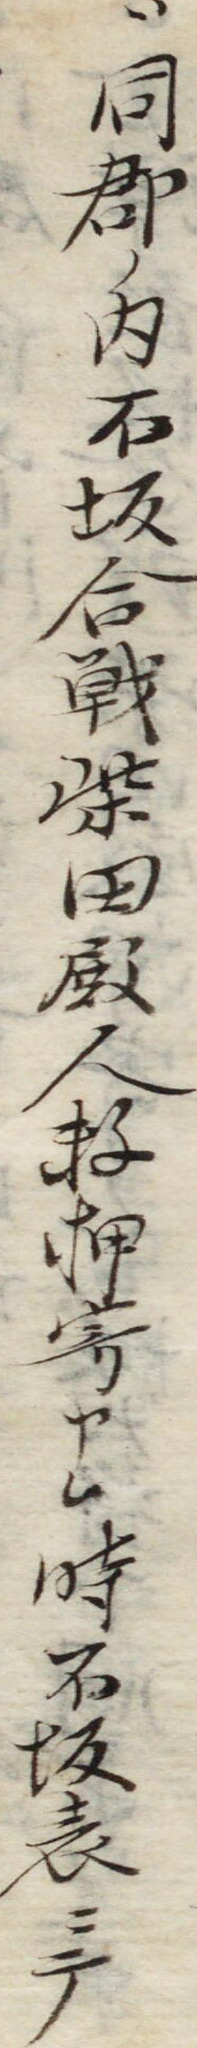○同郡ノ内石坂合戦柴田殿人数押寄申候不坂表ニテ
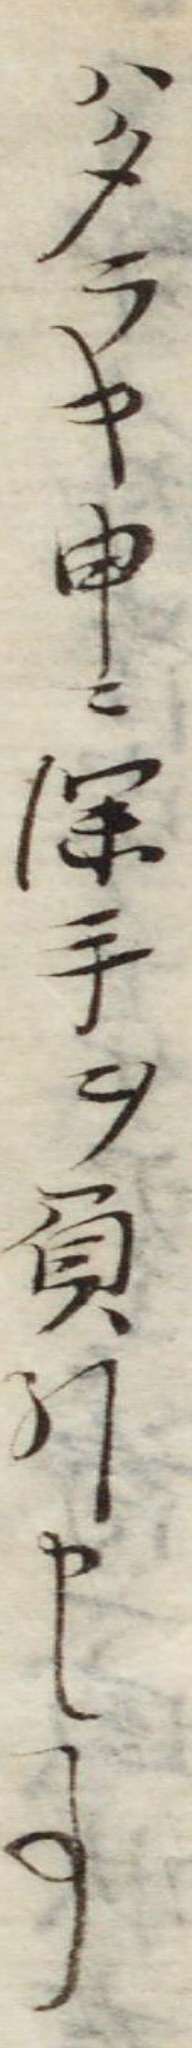ハタラキ申ニ深手ヲ負引申候事
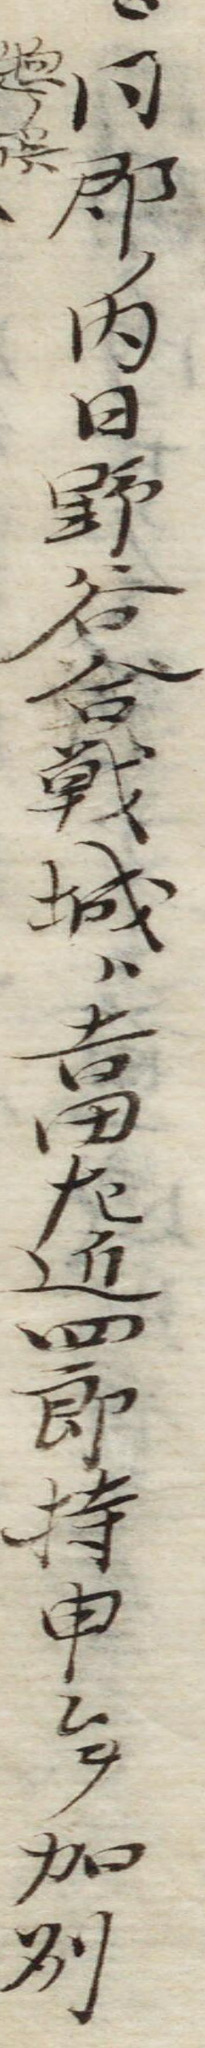○同郡ノ内日野谷合戦城ハ吉田左近四郎持申候ヲ加州
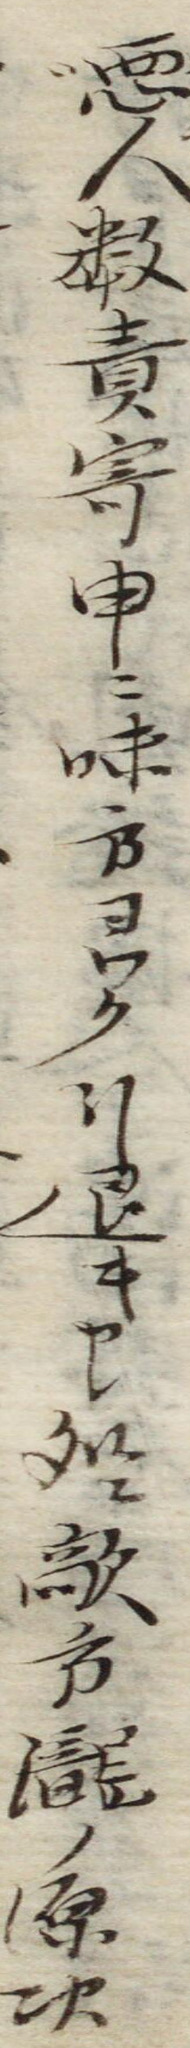悪人数責寄申ニ味方ヨワク引退キ申候処ニ敵方瀧ノ源次
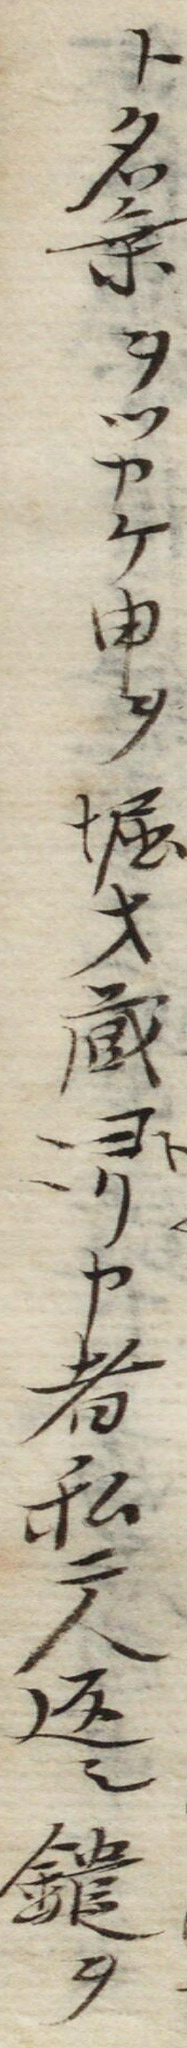ト名乗ヲツカケ申ヲ堀才蔵ヨリ申者私二人返シ鑓ヲ

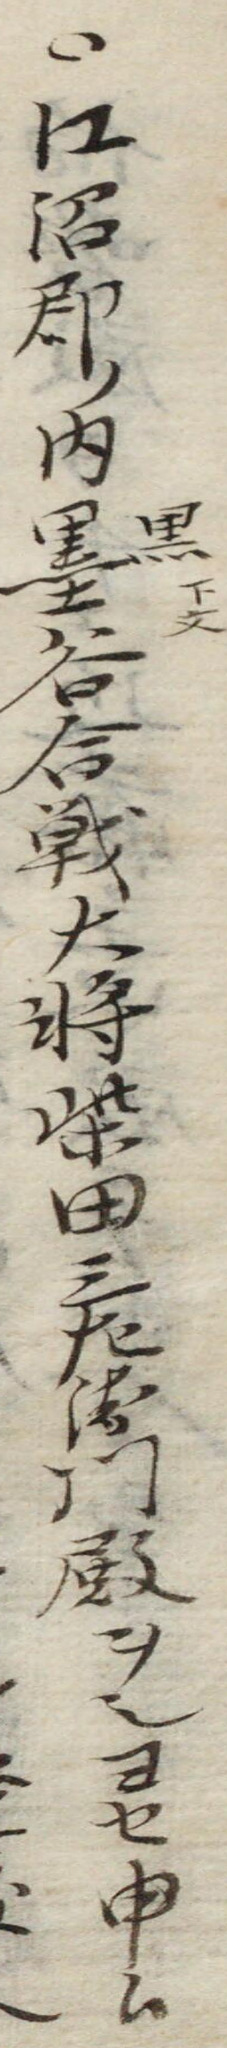〇江沼郡ノ内墨谷合戦大将柴田三左衛門殿ヲシヨセ申候
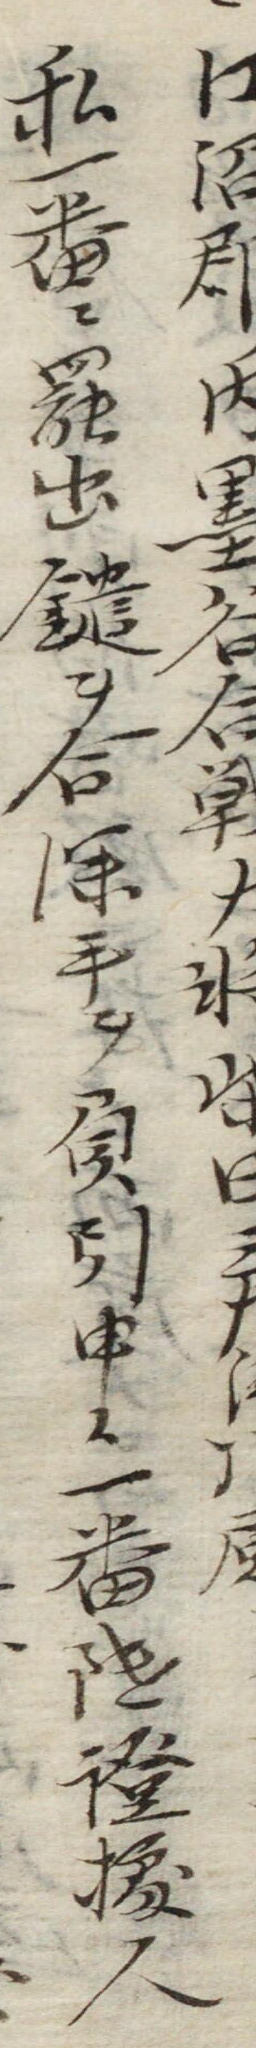私一番ニ罷出鑓ヲ合深手ヲ負引申候一番随証拠人
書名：聞見雑録
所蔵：Ishikawa Prefectural Library
